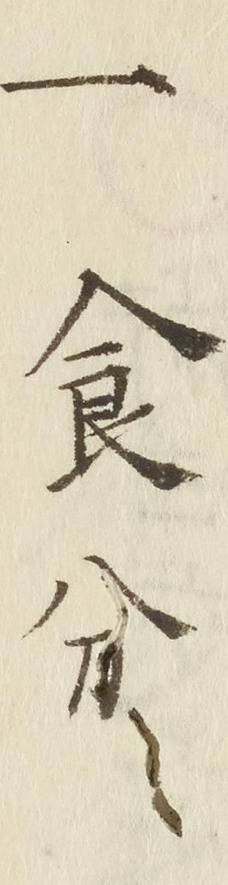一食分
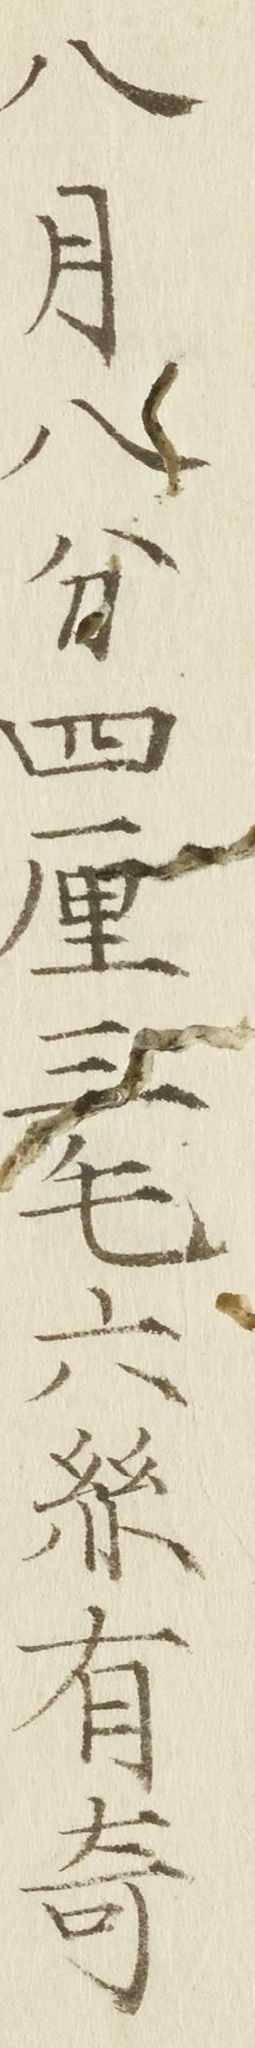八月八分四厘三毛六糸有奇
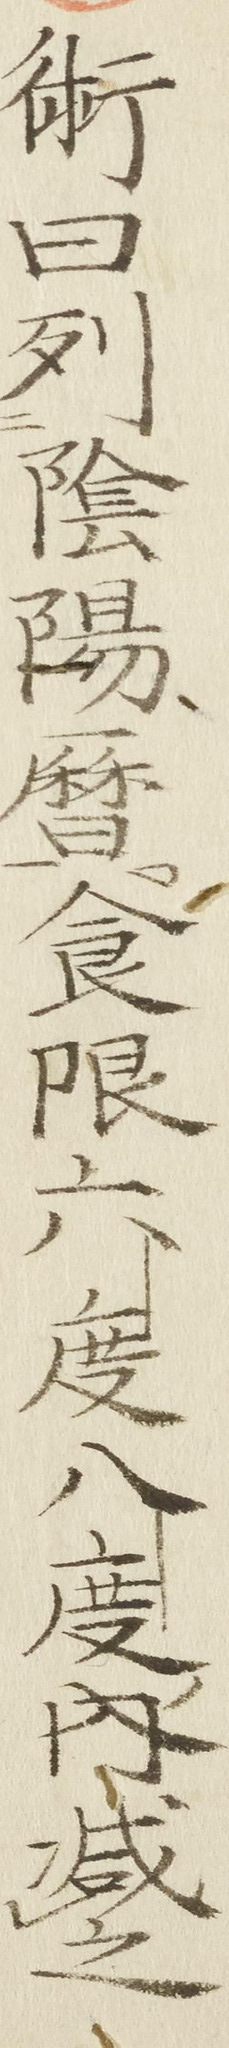○術曰列陰陽暦食限六度八度内減之
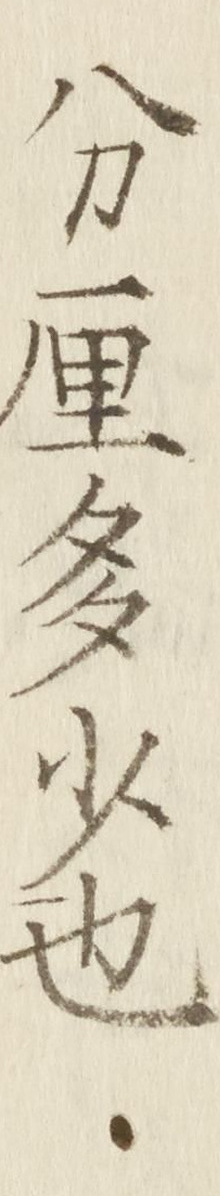分厘多少也
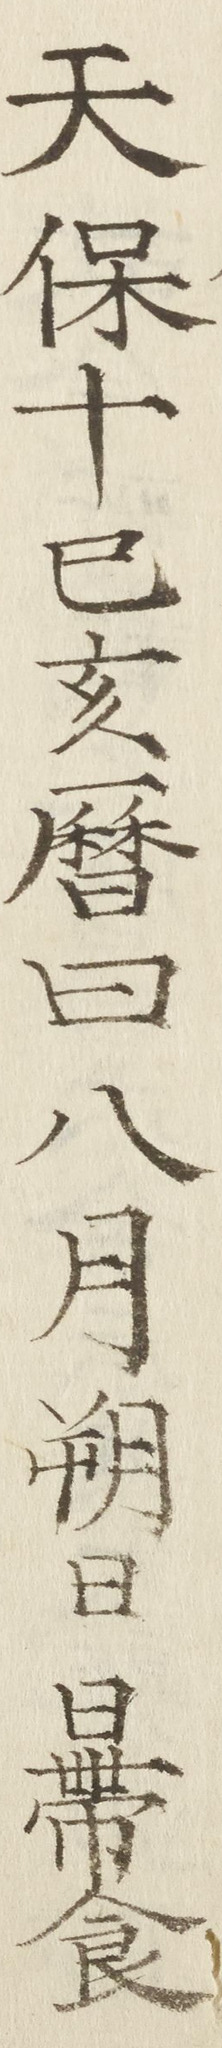天保十己亥暦曰八月朔日日帯食
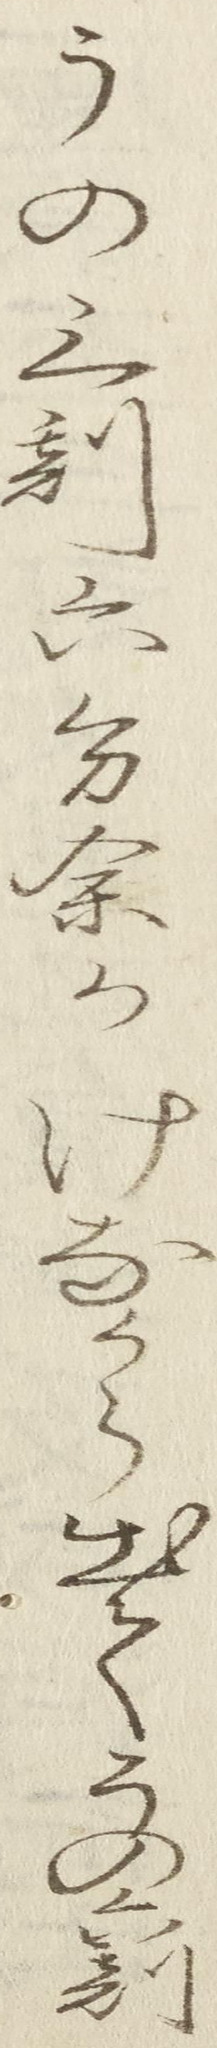うの三刻六分余かけなから出てうの六刻
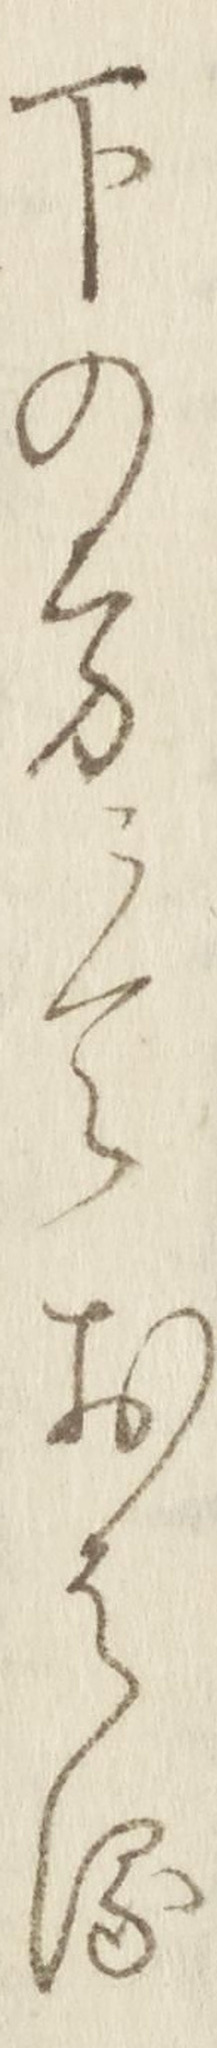下の分ニておはる
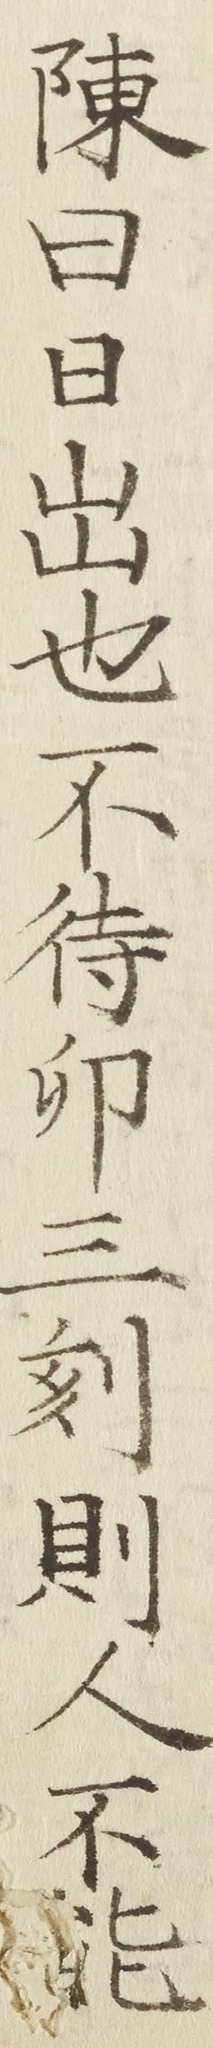陳曰日出也不待卯三刻則人不能
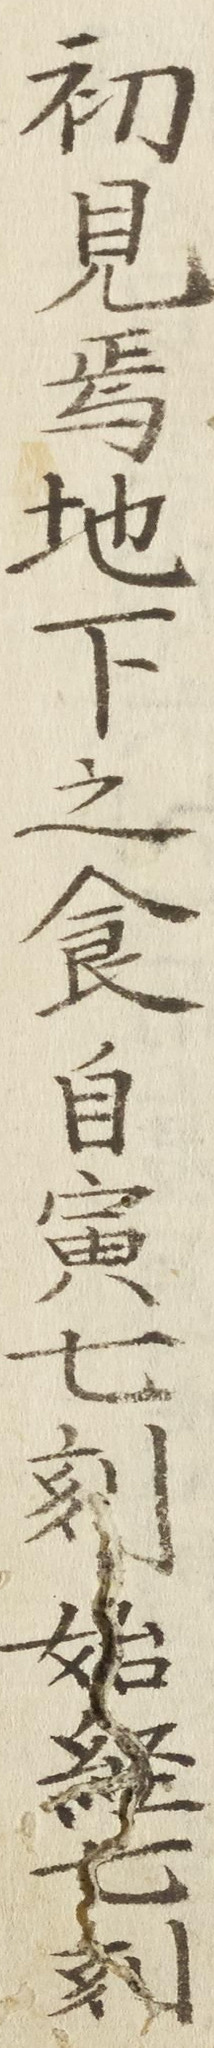初見焉地下之食自寅七刻始経七刻

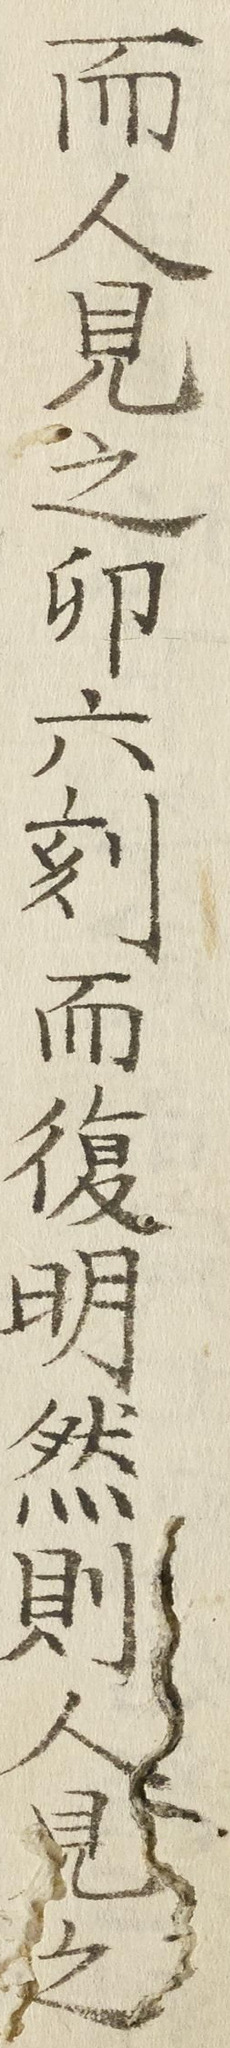而人見之卯六刻而復明然則人見之
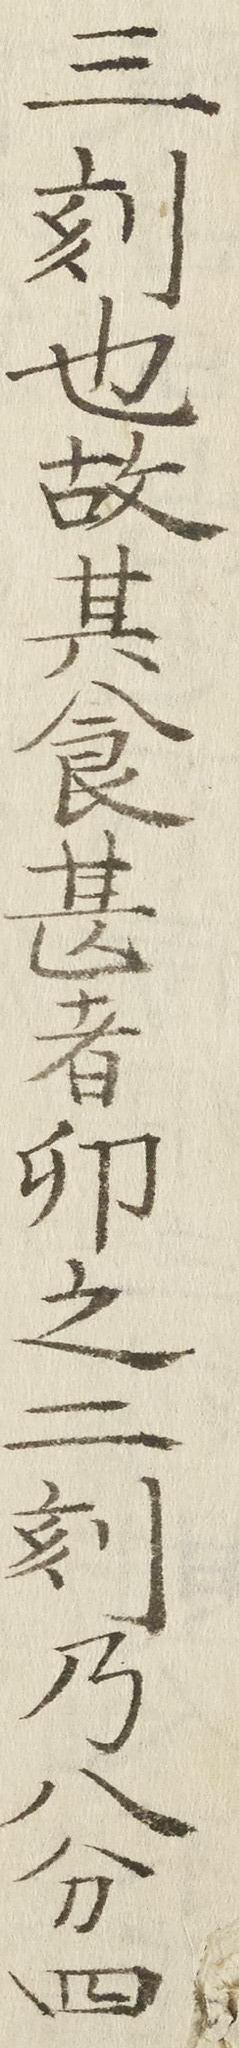三刻也故其食甚者卯之ニ刻乃八分四
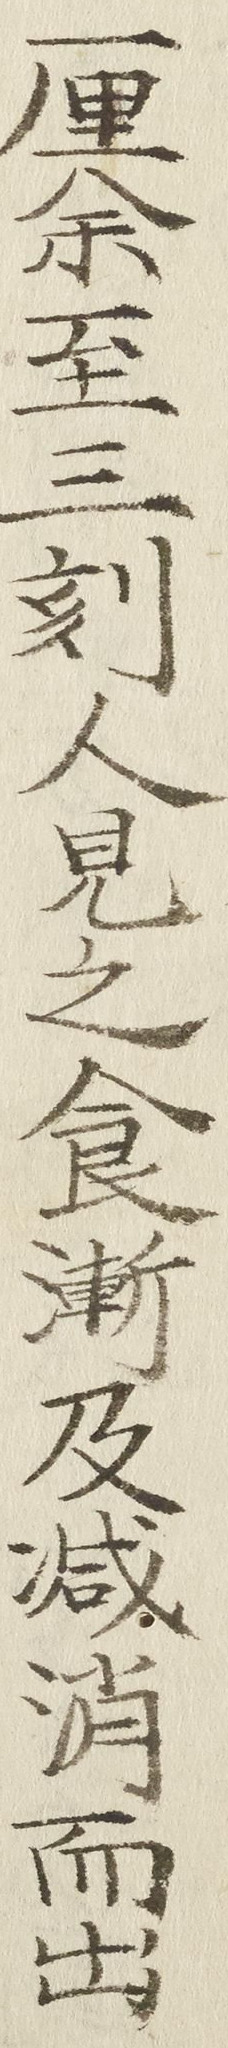厘余至三刻人見之食漸及減消而出
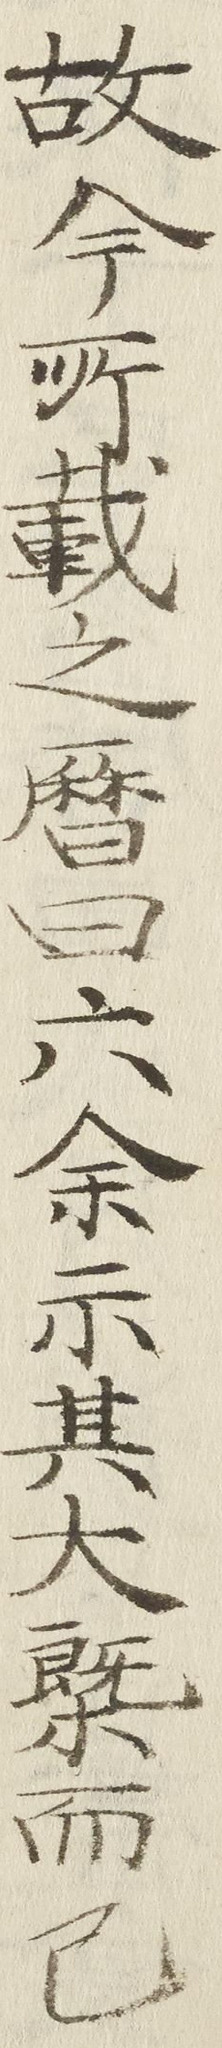故今所載之暦曰六余示其大概而已
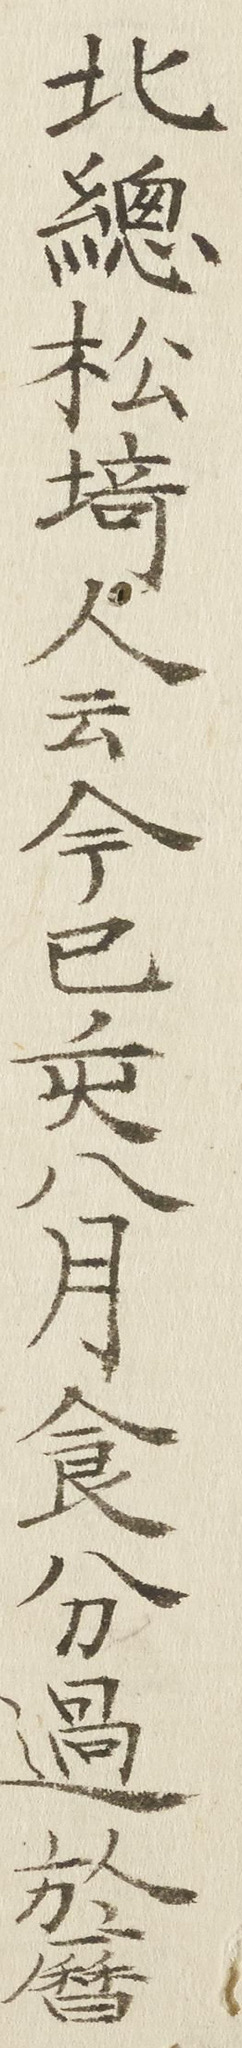北総松埼人云今己亥八月食分過於暦
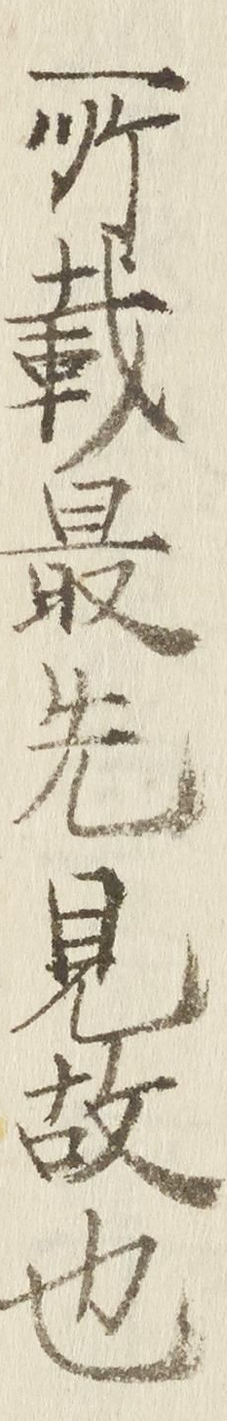所戴最先見故也
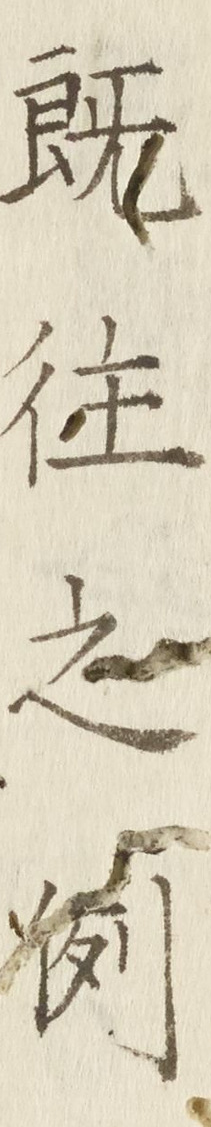既往之例
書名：日食度
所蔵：東京大学地震研究所図書室 Earthquake Research Institute Library, The University of Tokyo, JAPAN
